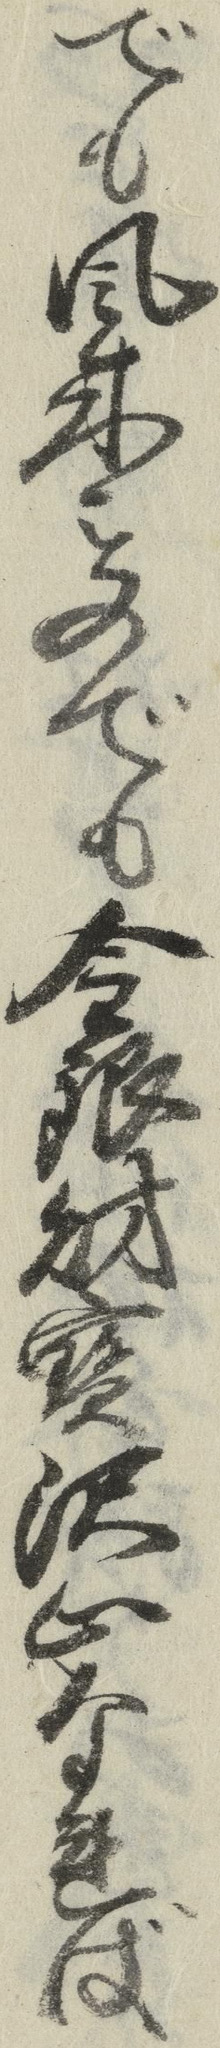でも風来ものでも金銀財宝沢山なれば
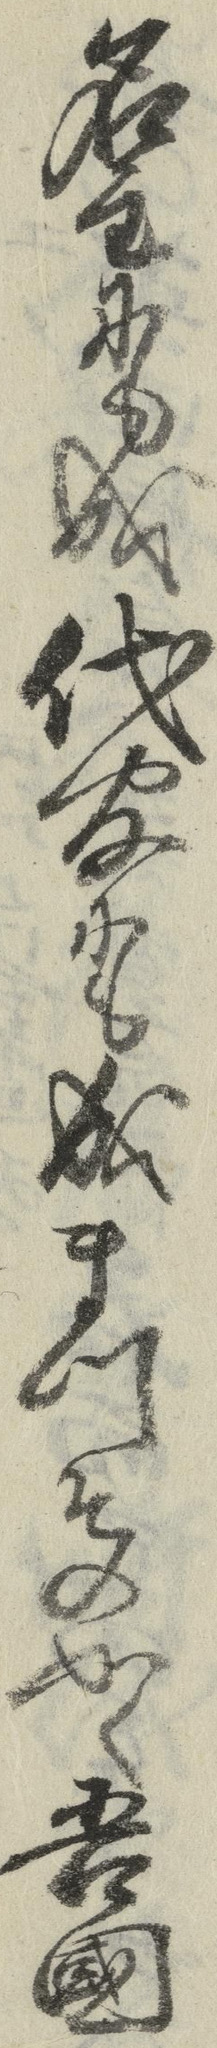名主にも成代官にも成まつその如く吾国

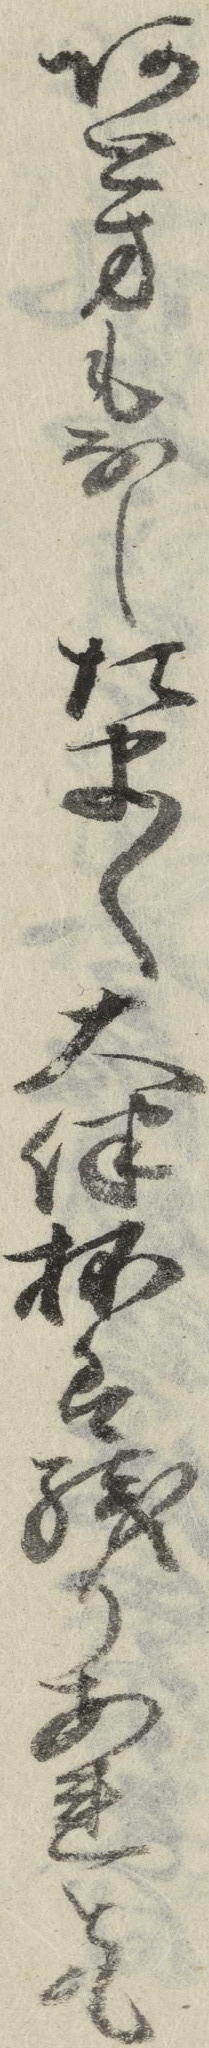何と方もなしたま〳〵大伴様は残りあれとも
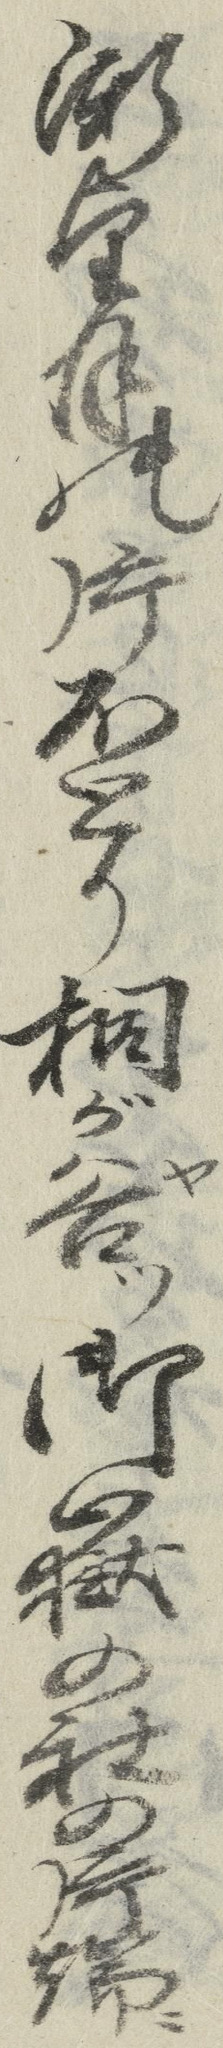漸望月の片不とり桐が谷御嶽の社の片端に
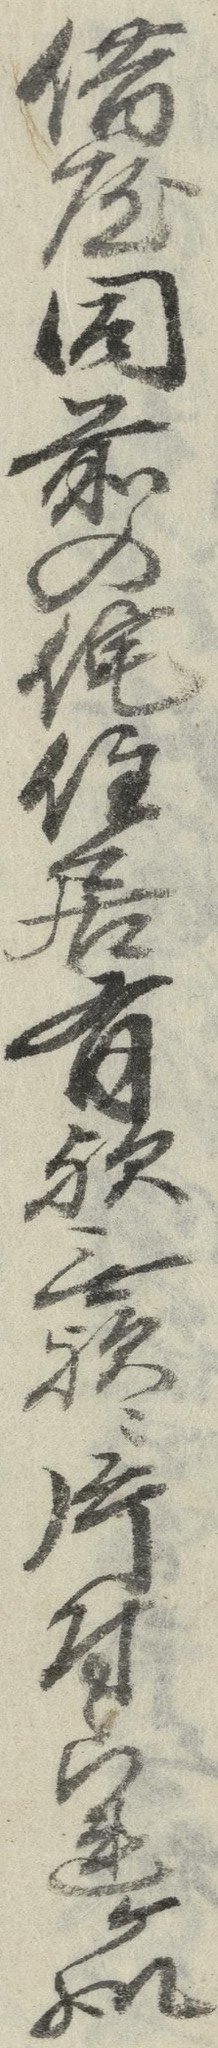借家同前の侘住居有歟無歟に片付られヶ様
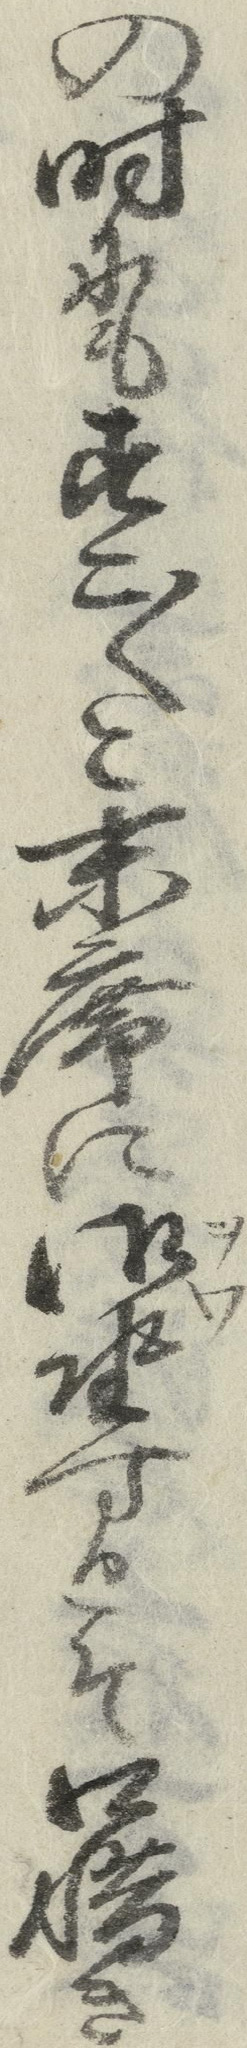の時にもすご〳〵と末席に御坐するこそ口惜き
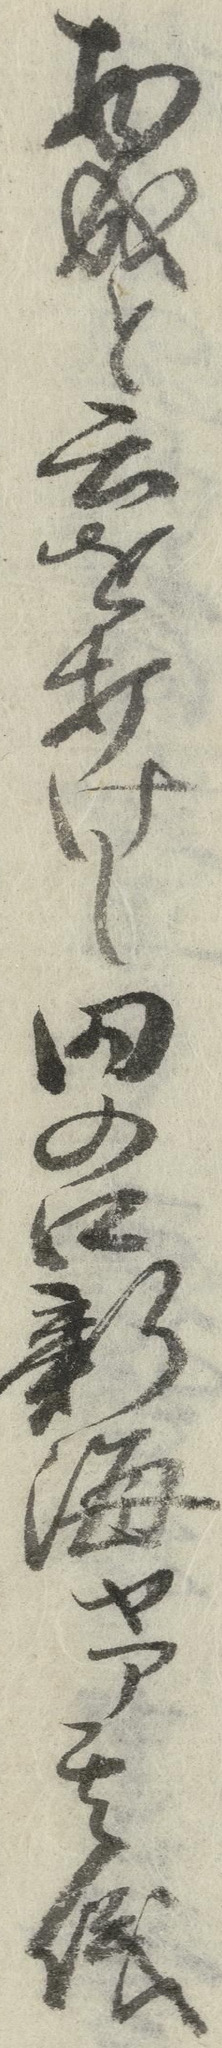相成と云を打けし田の口新海其儀
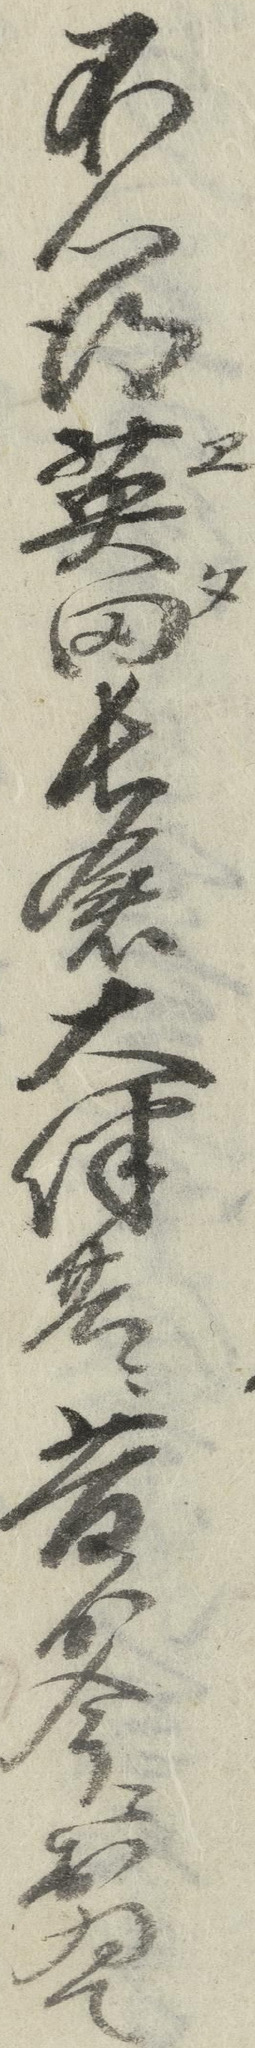不心得英田長倉大伴共に昔ゟ今におゐて
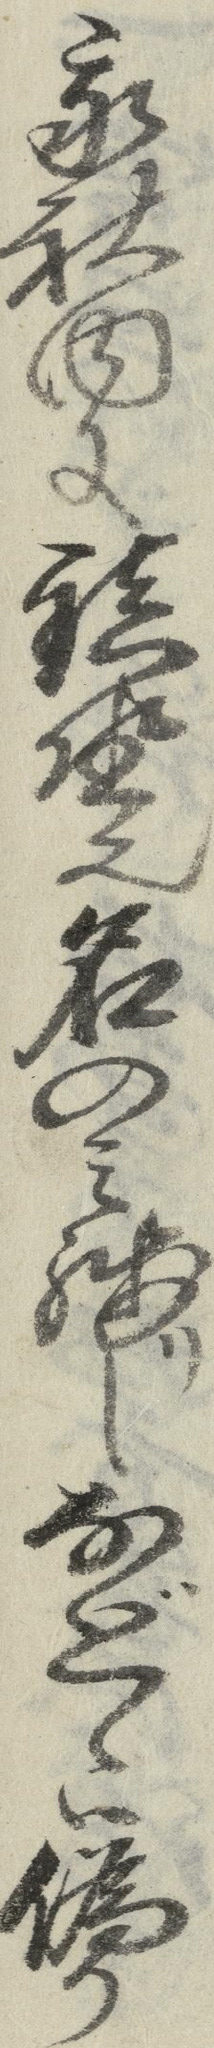我社内に鎮座之名のみ残ヽは偽り
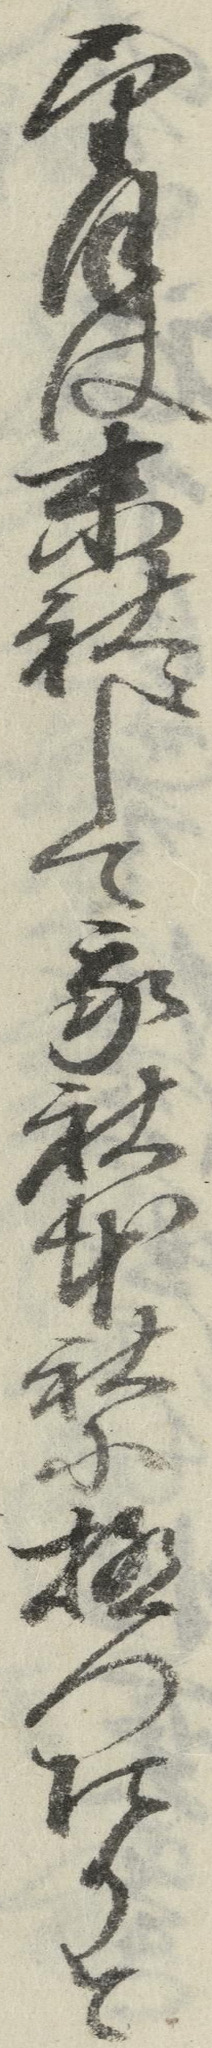望月は末社にして我社本社に極つたりと
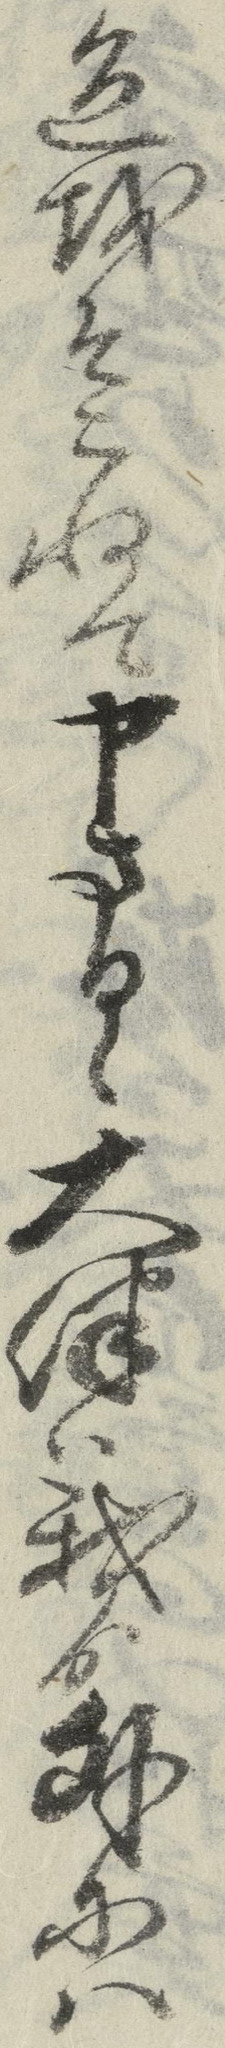色をそこねて申さるヽ大伴は我ゟ外には
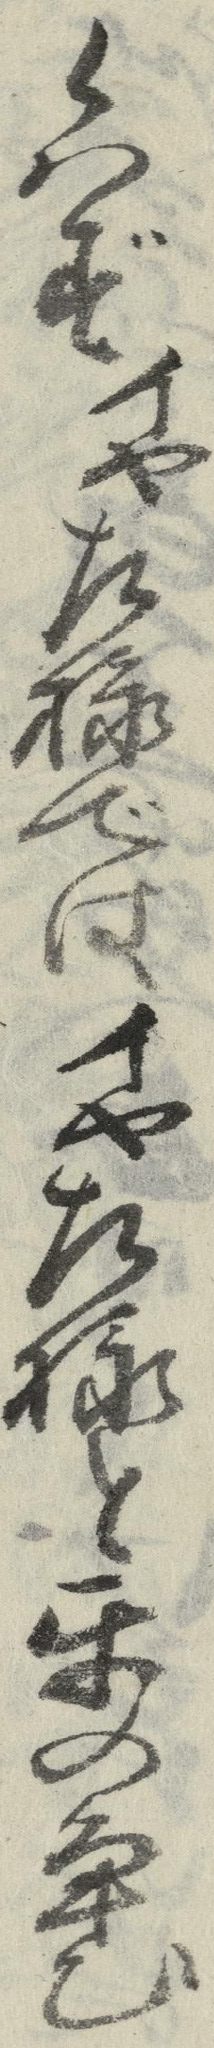候はず左様では左様と互の争ひ
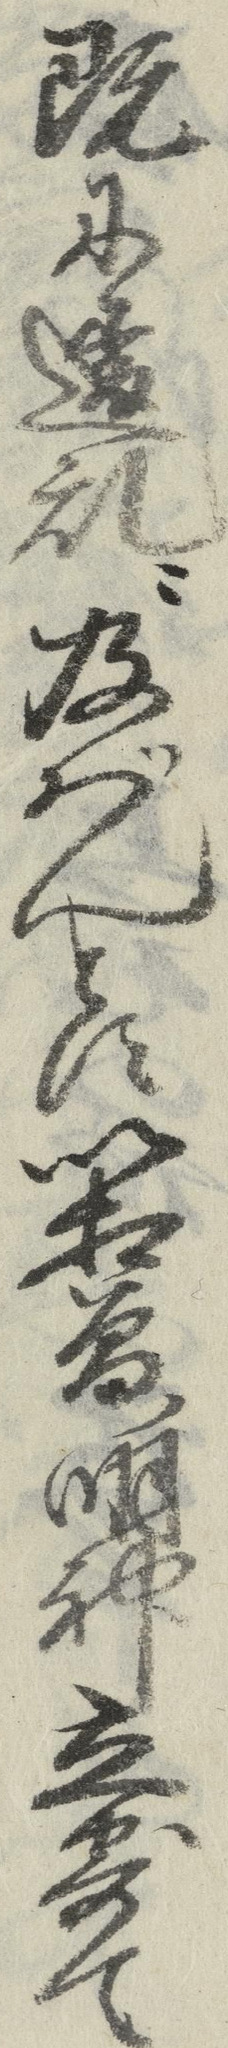既に違乱に及ばんとす以相曽明神立寄て
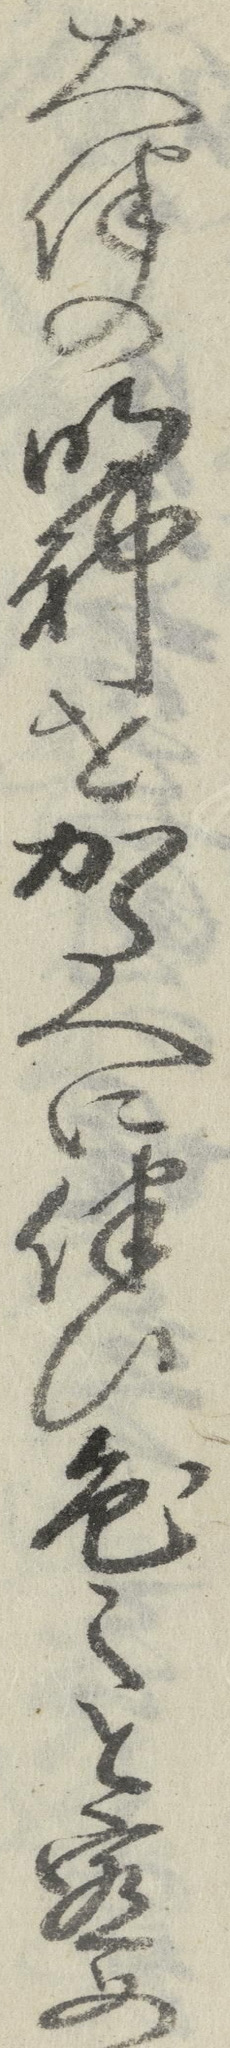大伴の明神をかたへに伴ひ色々と宥め
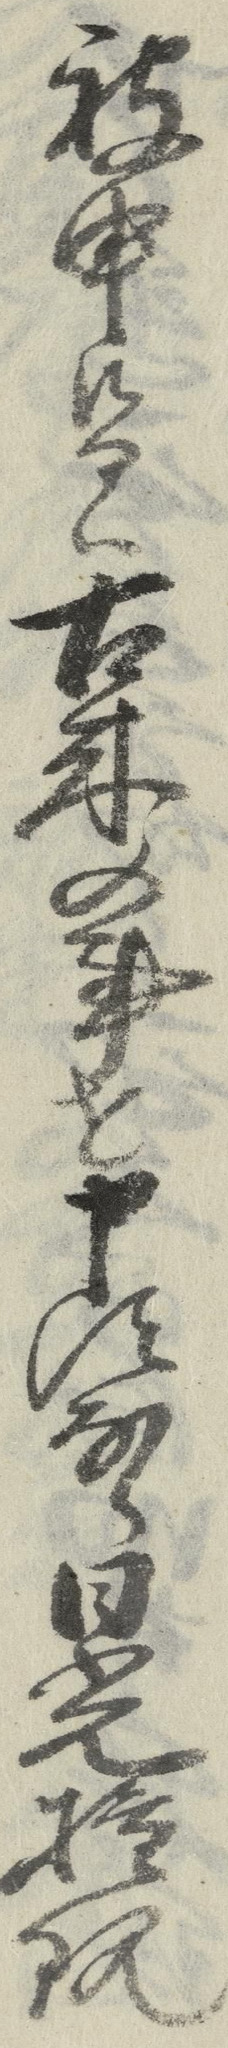被申候而は迚も古来の事を申すなら日光権現
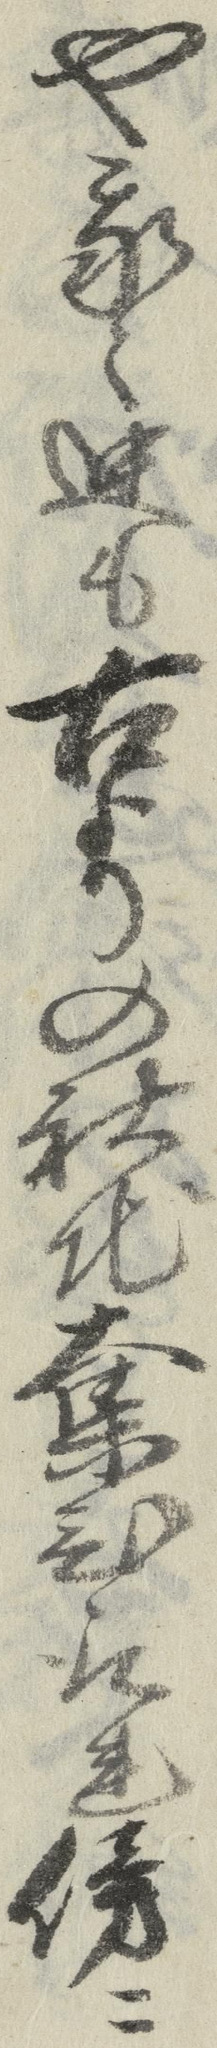や我々迚も古よりの社地奪ひ取れ傍に
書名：浅間大焼騒動記　上
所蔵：東京大学地震研究所図書室 Earthquake Research Institute Library, The University of Tokyo, JAPAN
